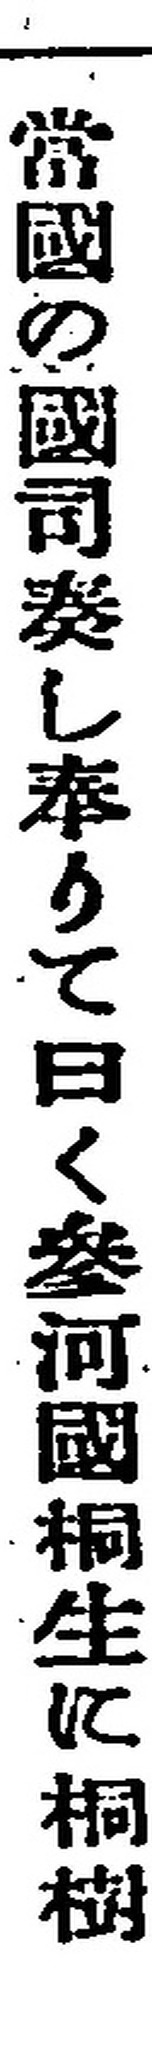当国の国司奏し奉りて曰く参河国桐生に桐樹
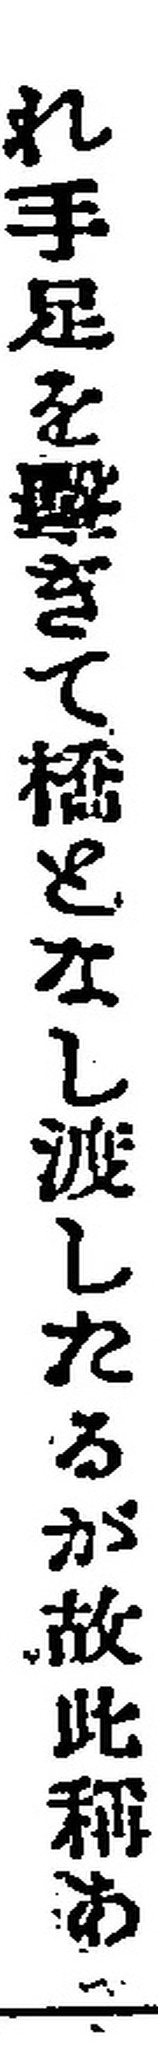れ手足を繋ぎて橋となし渡したるが故此称あ
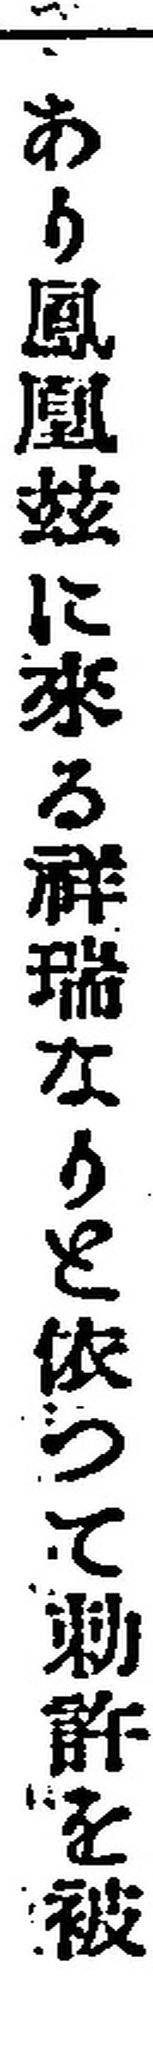あり鳳凰茲に来る祥瑞なりと依つて勅許を被
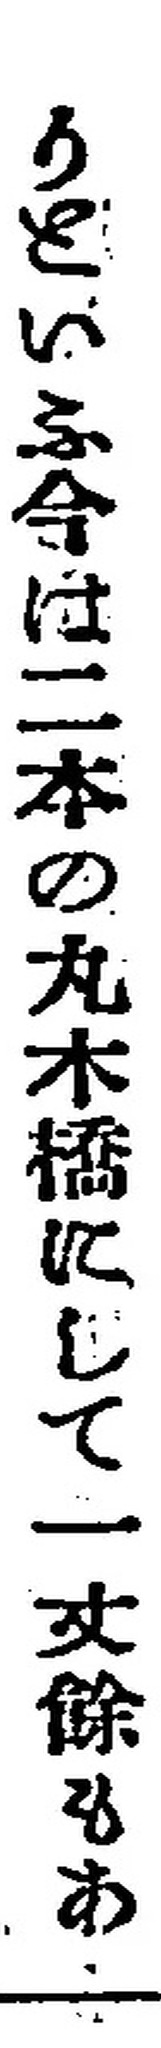りといふ今は二本の丸木橋にして一丈余もあ
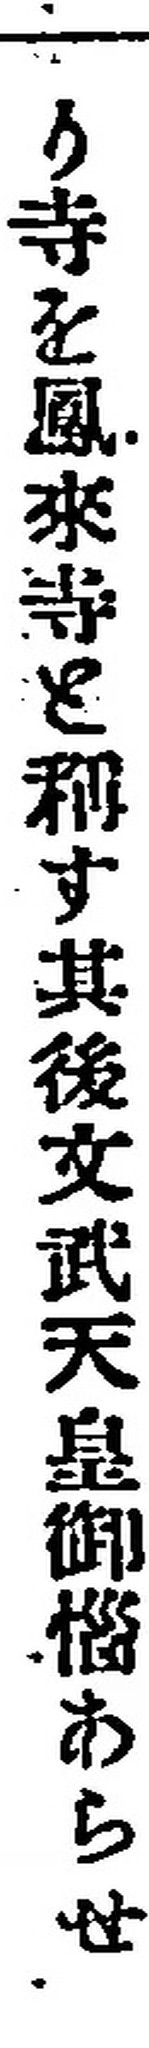り寺を鳳来寺と称す其後文武天皇御悩あらせ
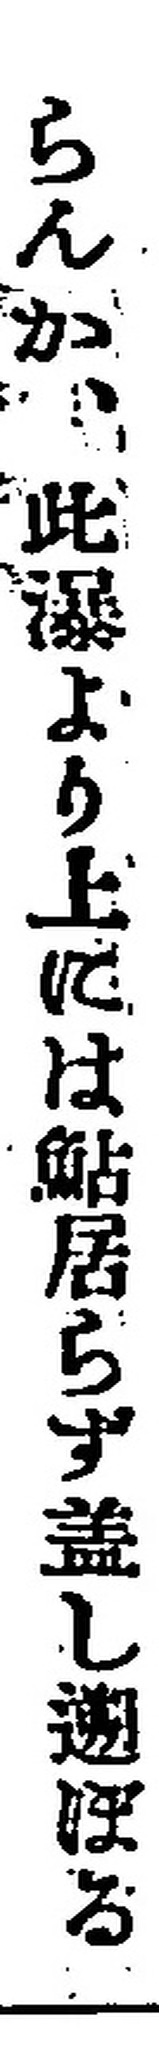らんか、此瀑より上には鮎居らず蓋し遡ぼる
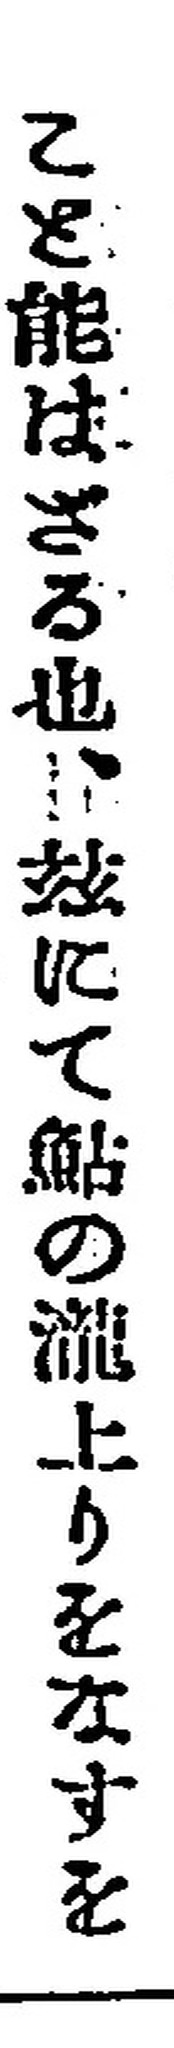こと能はざる也、茲にて鮎の瀧上りをなすを
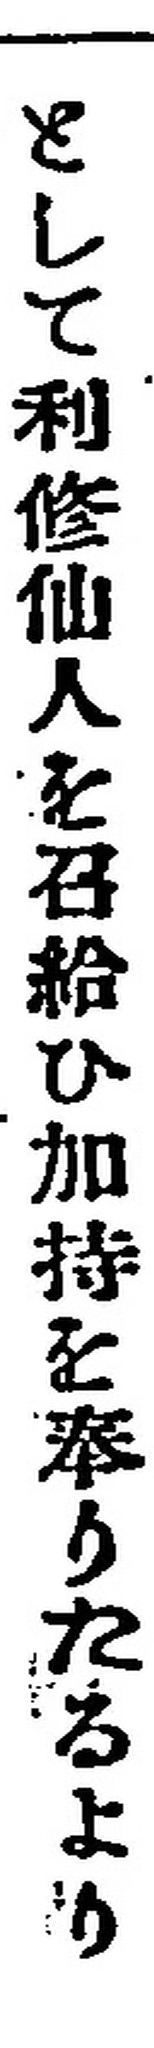として利修仙人を召給ひ加持を奉りたるより
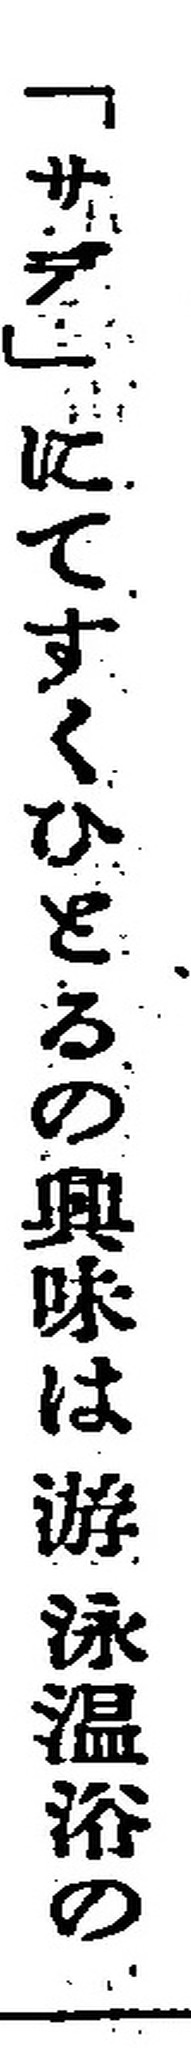「サデ」にてすくひとるの興味は遊泳温浴の
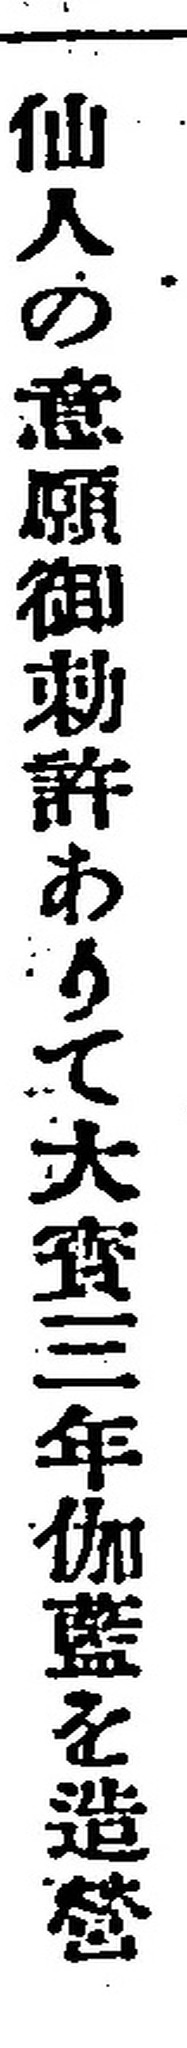仙人の意願御勅許ありて大宝三年伽藍を造営
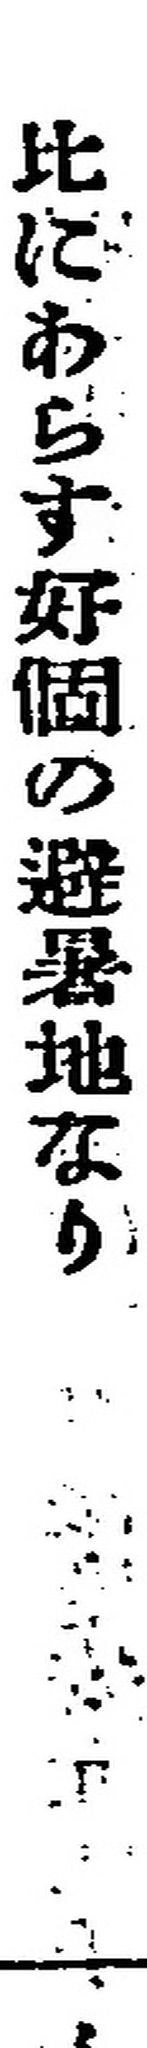比にあらす好個の避暑地なり
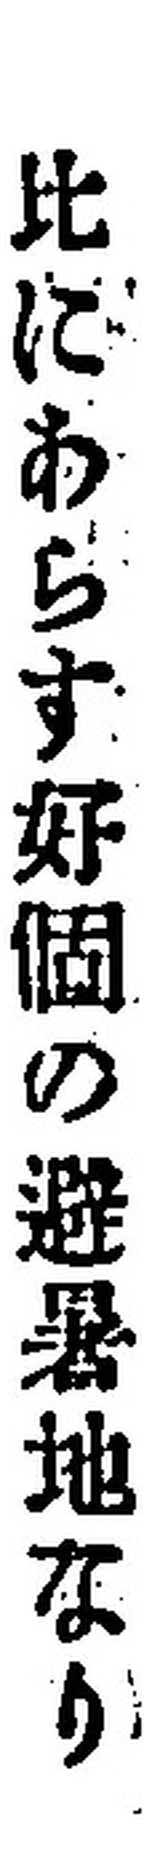比にあらす好個の避暑地なり
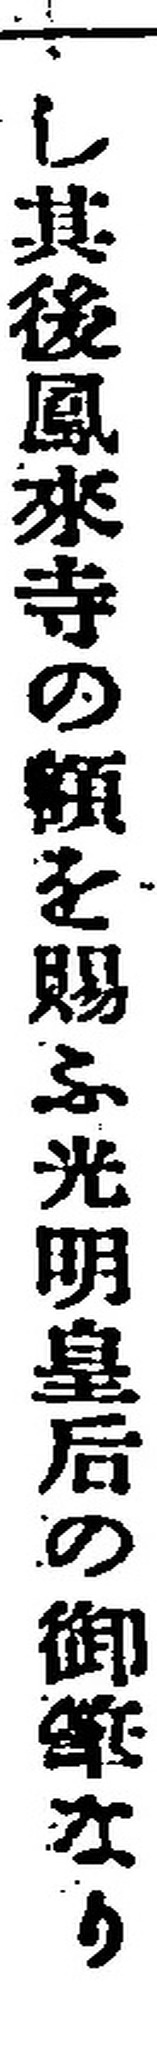し其後鳳来寺の額を賜ふ光明皇后の御筆なり
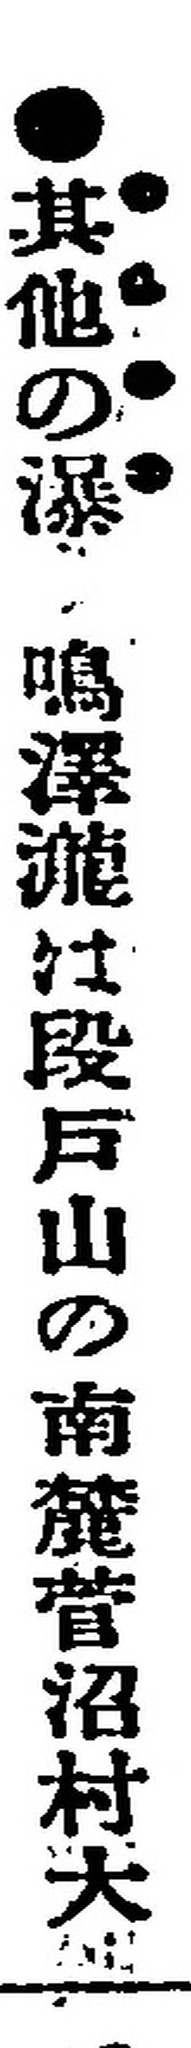●其他の瀑鳴沢瀧は段戸山の南麓菅沼村大
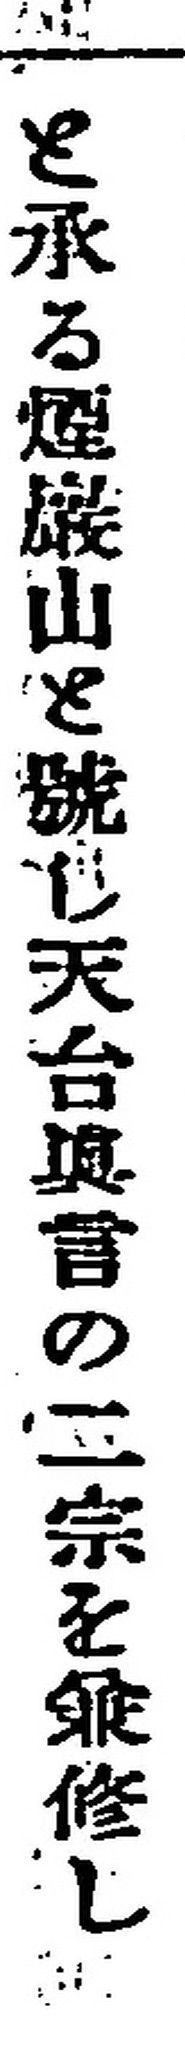と承る煙巌山と号し天台真言の二宗を兼修し
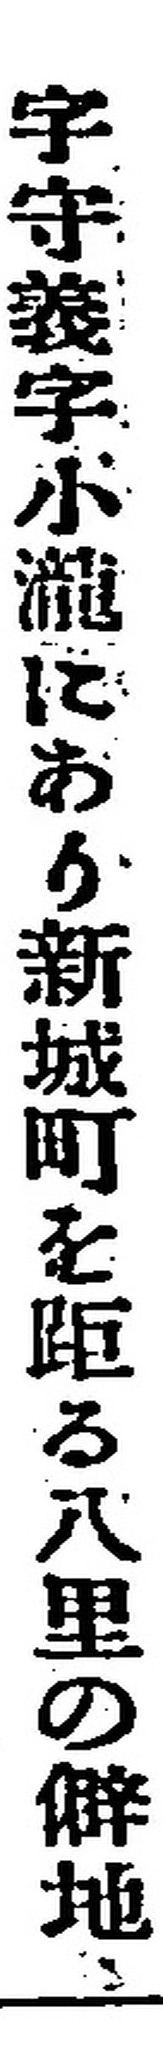字守義字小瀧にあり新城町を距る八里の僻地
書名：東参名勝案内
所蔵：国立国会図書館 National Diet Library, JAPAN
